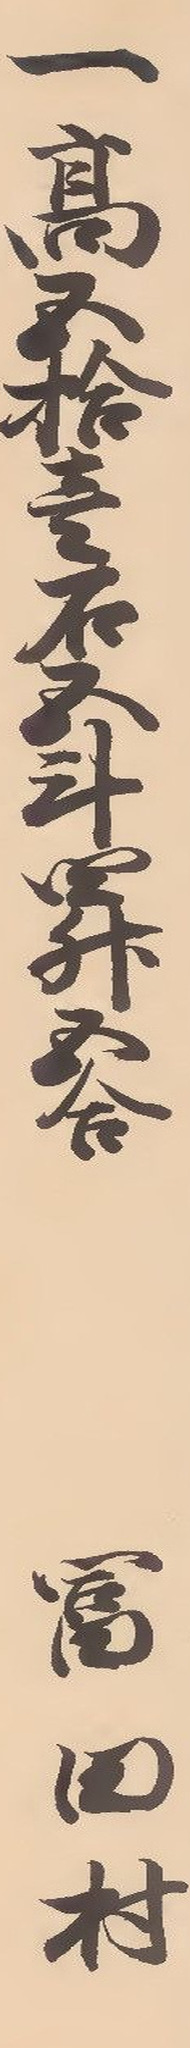一高五拾壱石五斗四升五合富田村
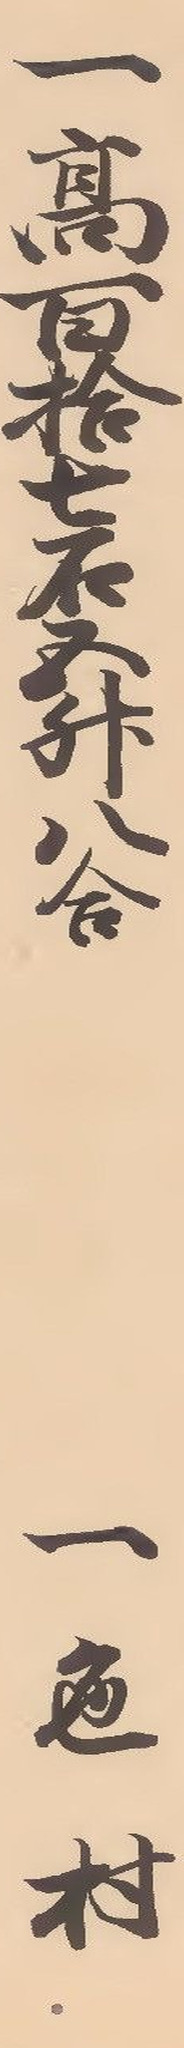一高百拾七石五升八合一色村
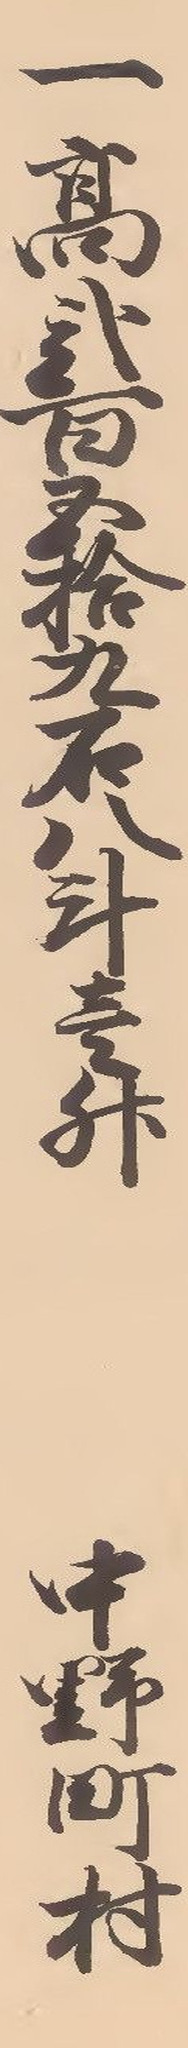一高弐百五拾九石八斗壱升中野町村
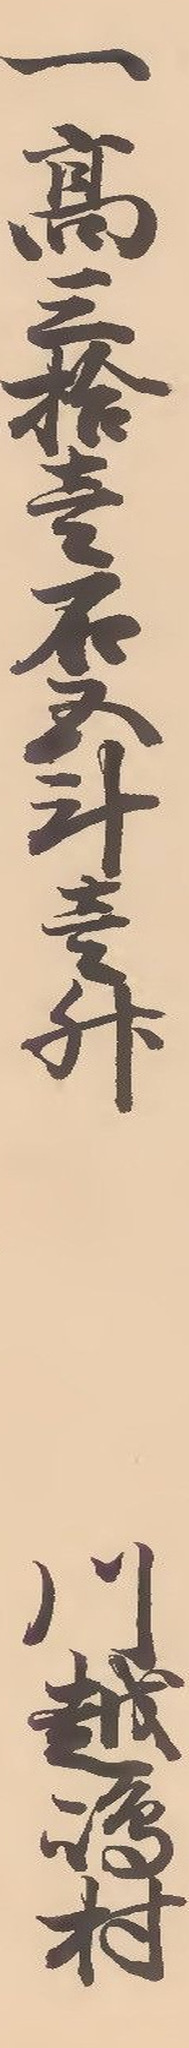一高三拾壱石五斗壱升川越島村

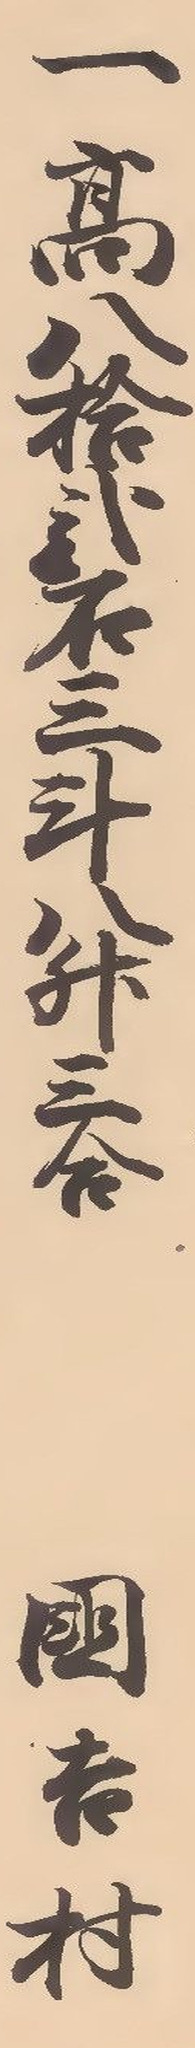一高八拾弐石三斗八升三合国吉村
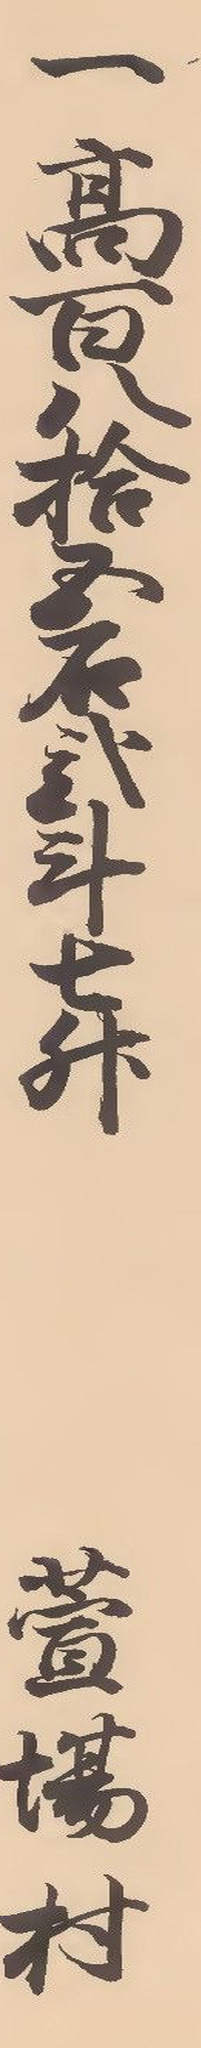一高百八拾五石弐斗七升萱場村
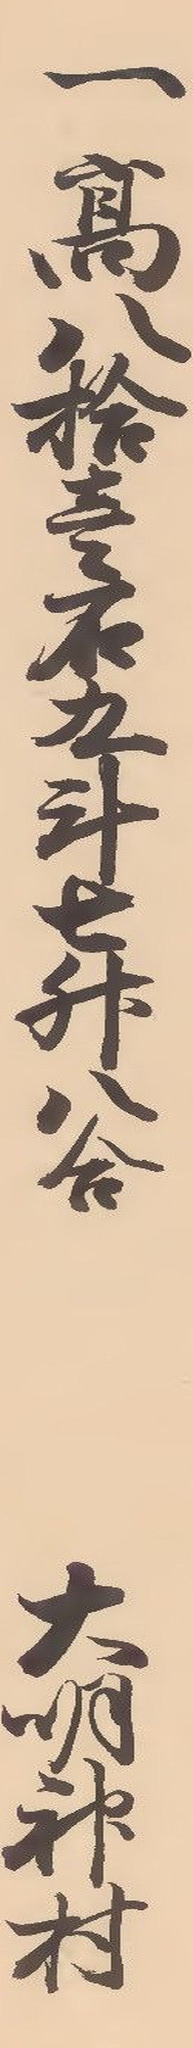一高八拾壱石九斗七升八合大明神村
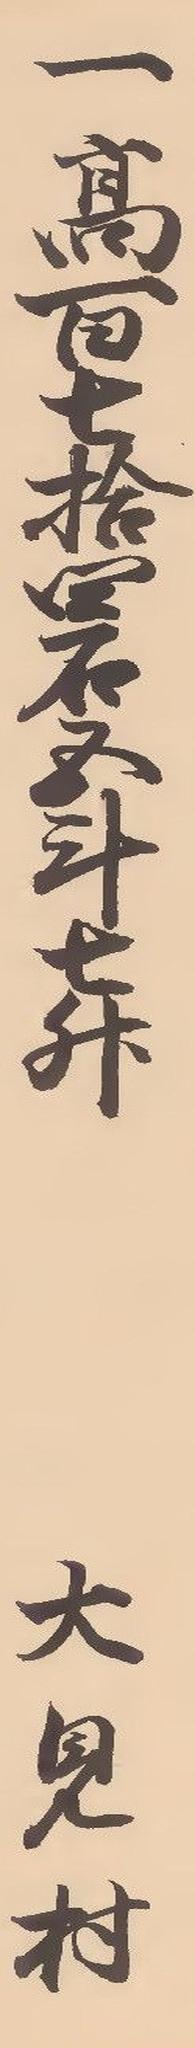一高百七拾四石五斗七升大見村
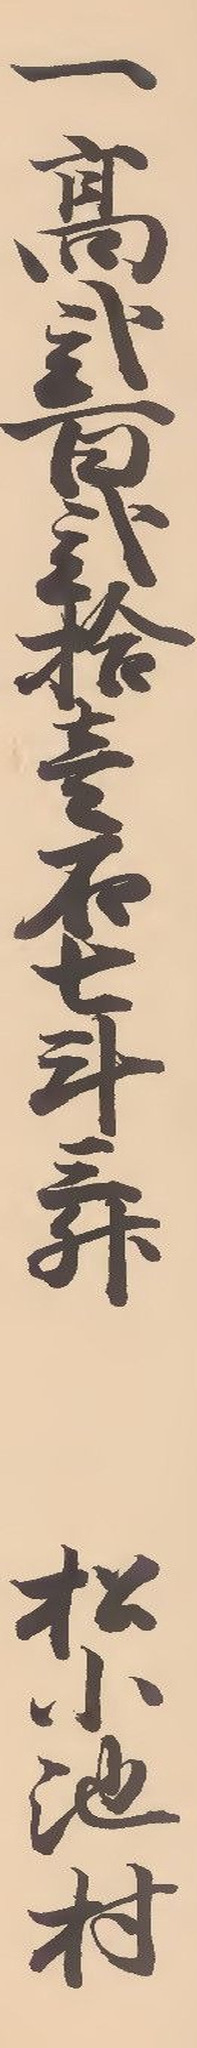一高弐百弐拾壱石七斗三升松小池村
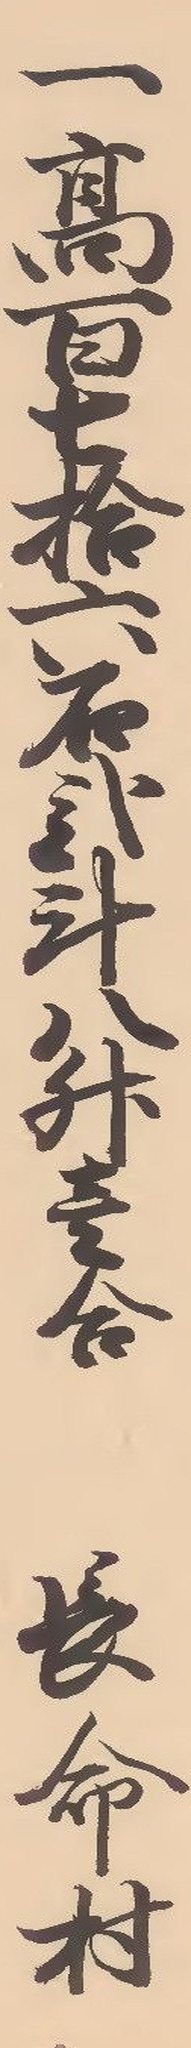一高百七拾六石弐斗八升壱合長命村
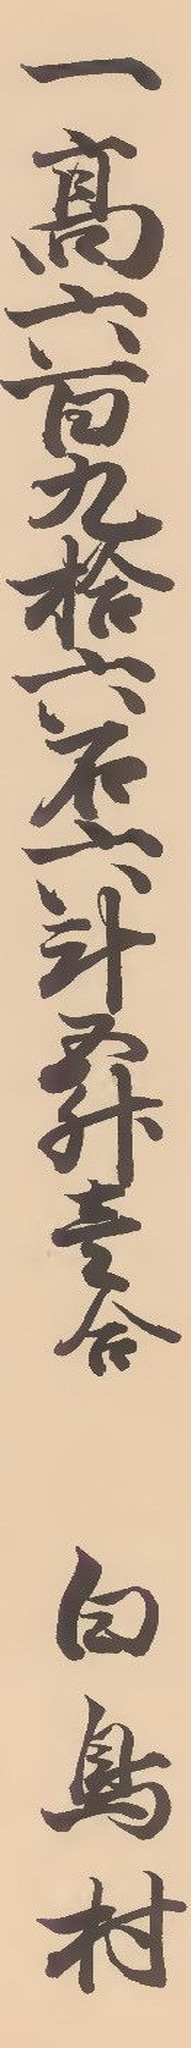一高六百九拾六石六斗五升壱合白鳥村
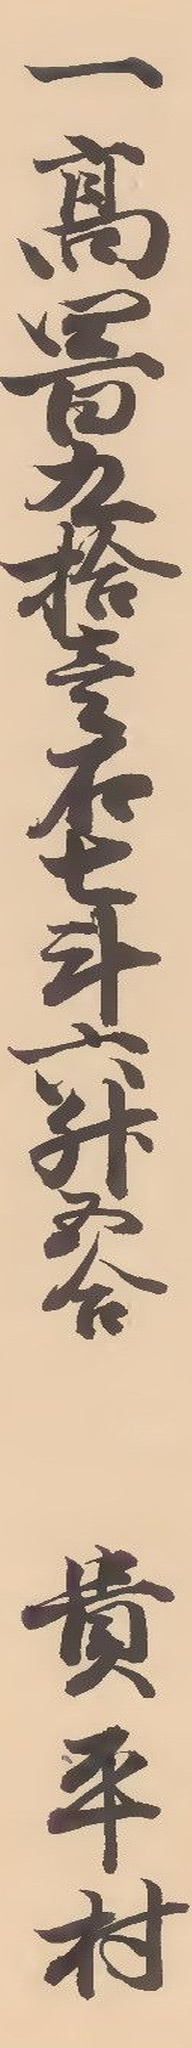一高四百九拾壱石七斗六升五合貴平村

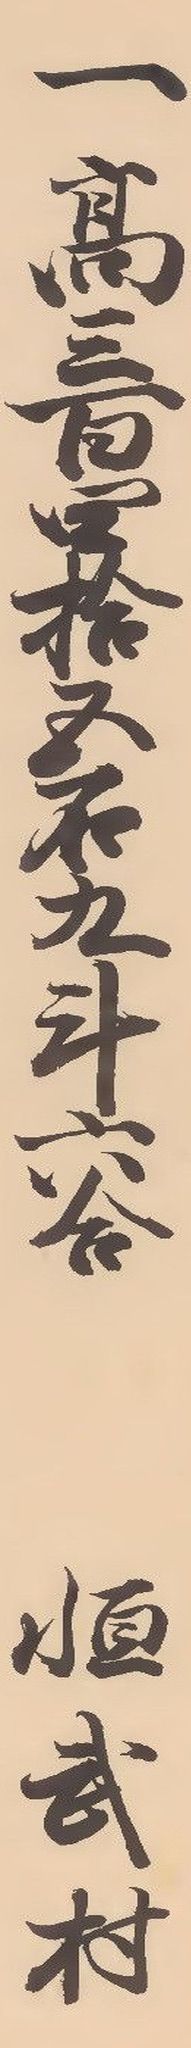一高三百四拾五石九斗六合恒武村
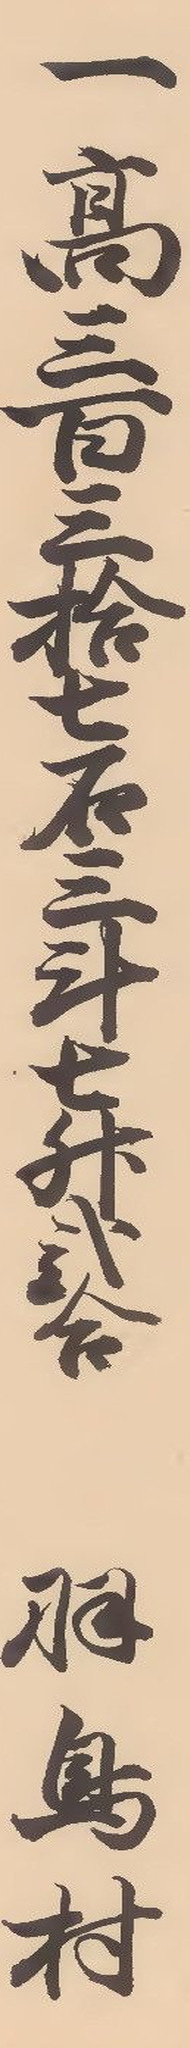一高三百三拾七石三斗七升弐合羽鳥村
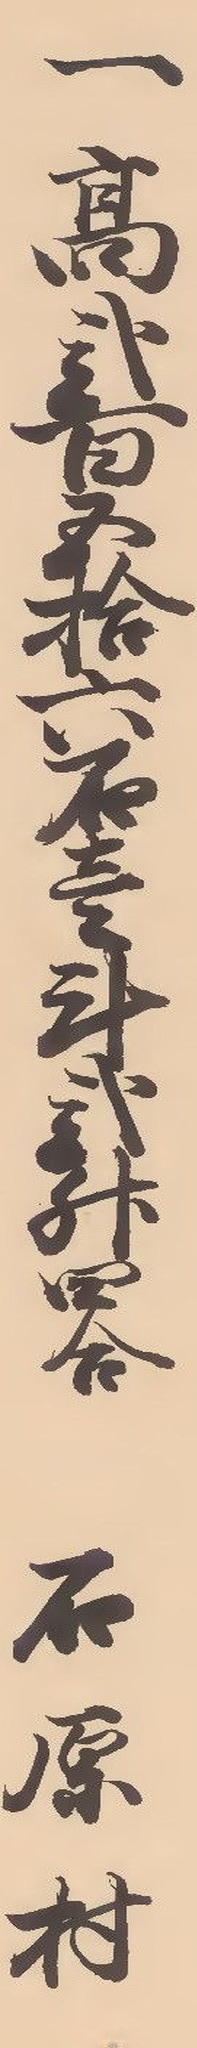一高弐百五拾六石壱斗弐升四合石原村
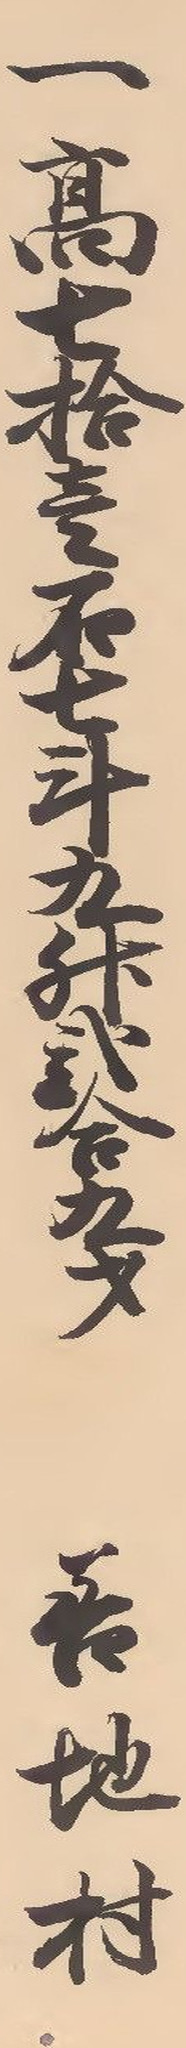一高七拾壱石七斗九升弐合九才善地村
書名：遠江国郷帳
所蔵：国立公文書館 National Archives of Japan
